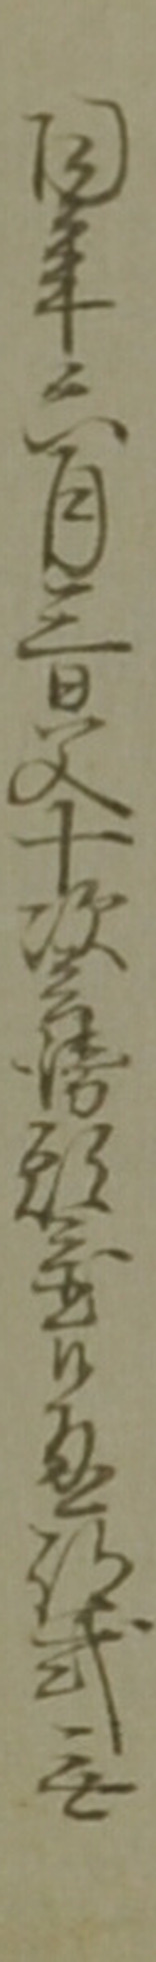一同年六月三日父十次兵衛願置候通跡式無
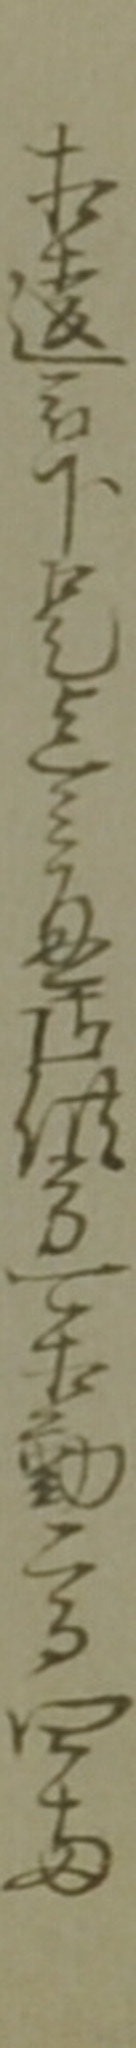相違被下是迄之通御供方可相勤高四両

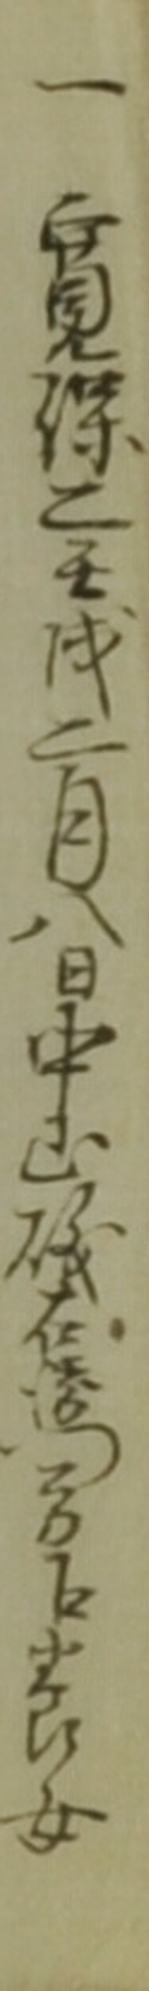一寛保二壬戌二月八日中山磯右衛門方江養女
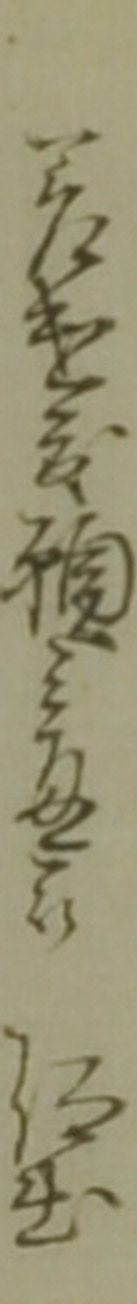差遣度願之通被仰出
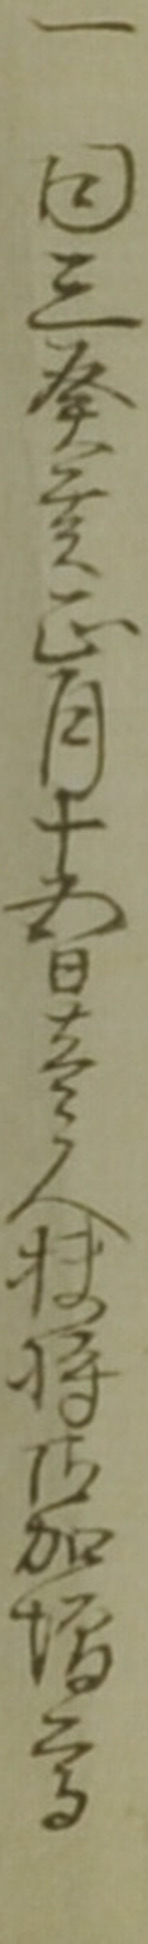一同三癸亥正月十五日壱人扶持御加増高
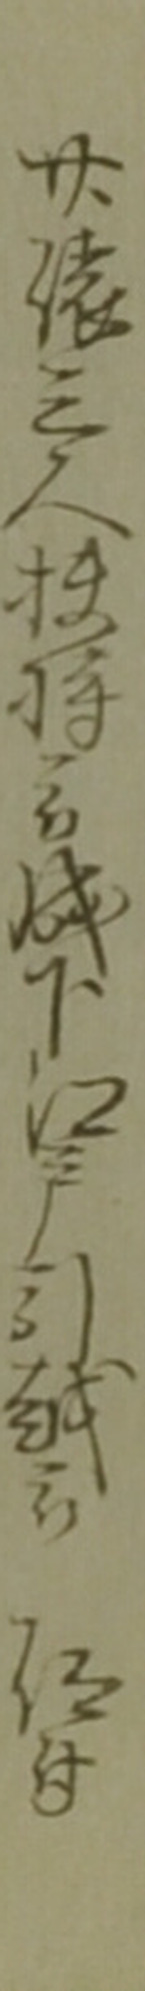廿俵三人扶持被成下江戸引越被仰付
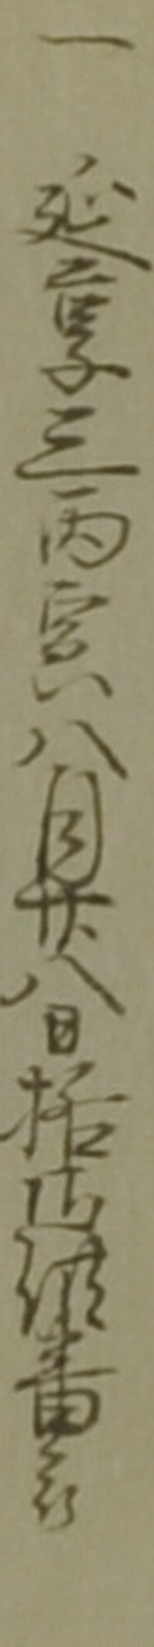一延享三丙寅八月廿八日格御供番被
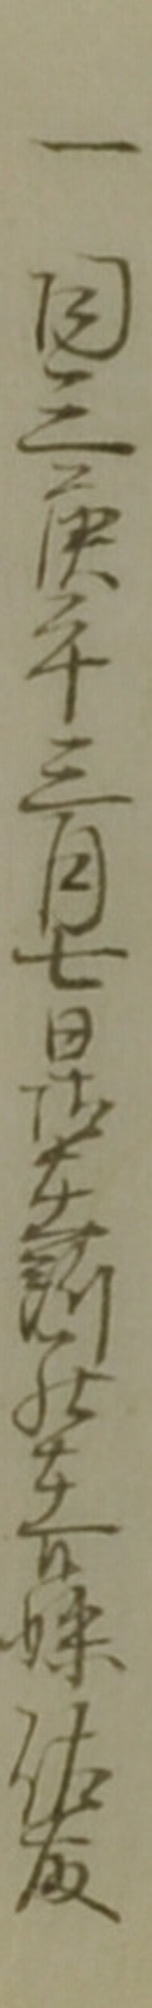一同三庚午三月七日御在所罷在候妹佐藤
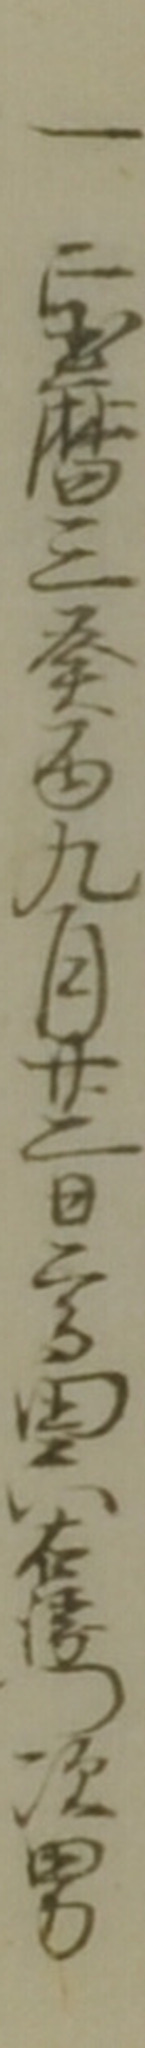一宝暦三癸酉九月廿二日高田六右衛門次男
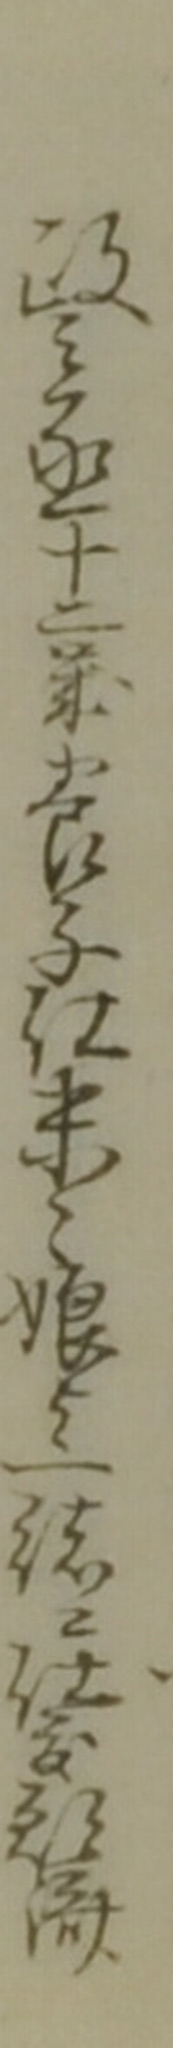政之丞十二歳養子仕末々娘与一緒ニ仕度願済
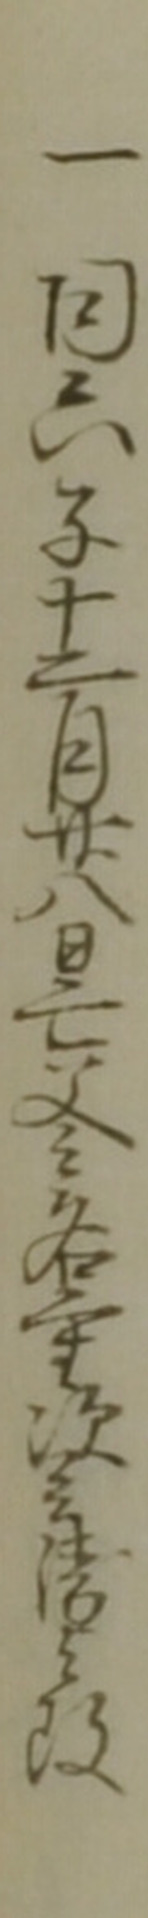一同六子十二月廿八日亡父之名重次兵衛与改
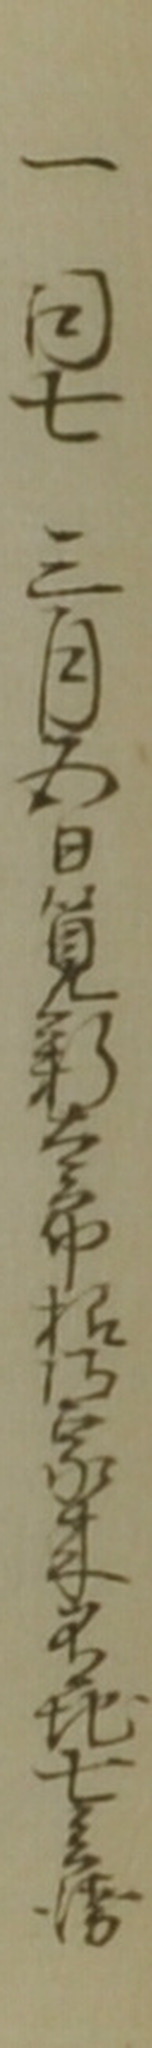一同七三月五日筧新太郎様御家来有地七兵衛
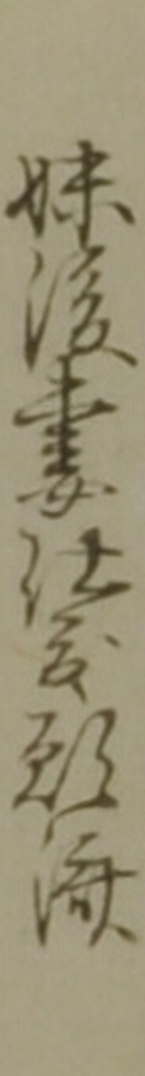妹後妻仕度願済
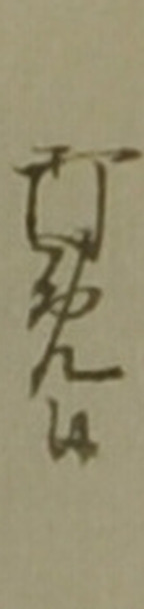御免候

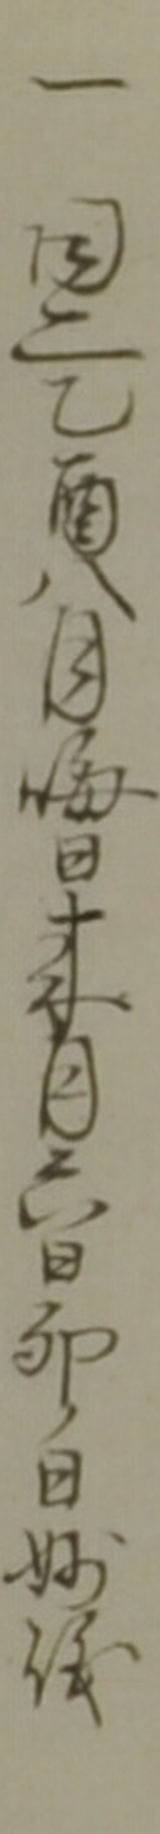一同二乙酉八月晦日来月六日卯ノ日妙儀
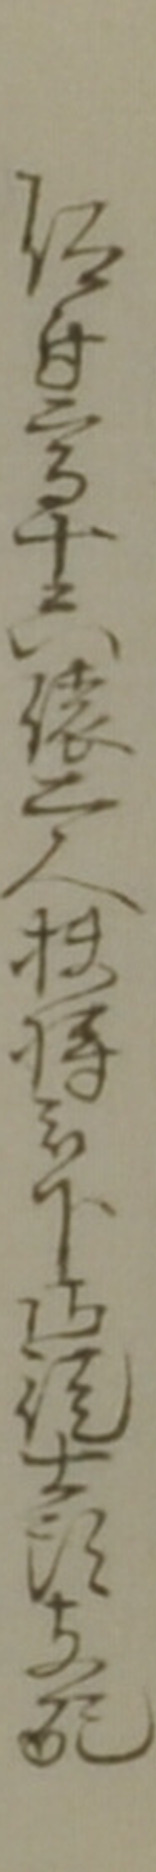仰付高十六俵二人扶持御徒士頭支配
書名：無足廃家（壱）
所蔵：伊那市立高遠町図書館・合同会社AMANE
